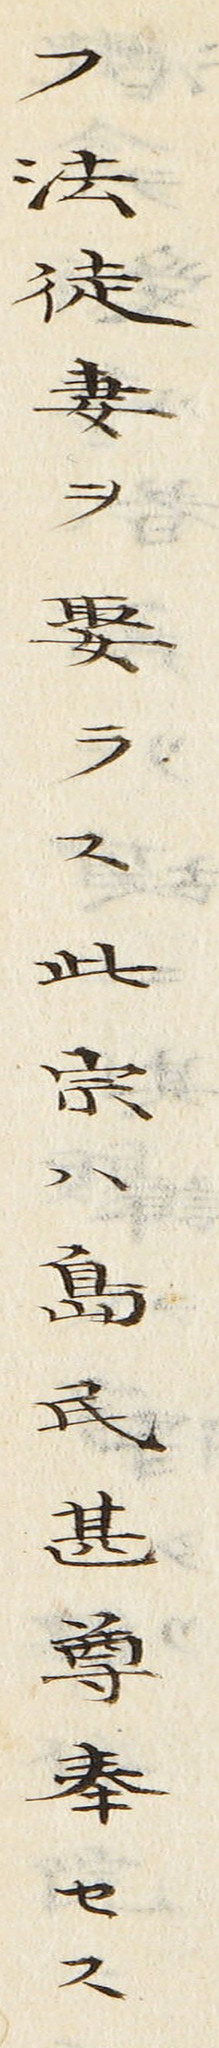フ法徒妻ヲ娶ラス此宗ハ島民甚尊奉セス
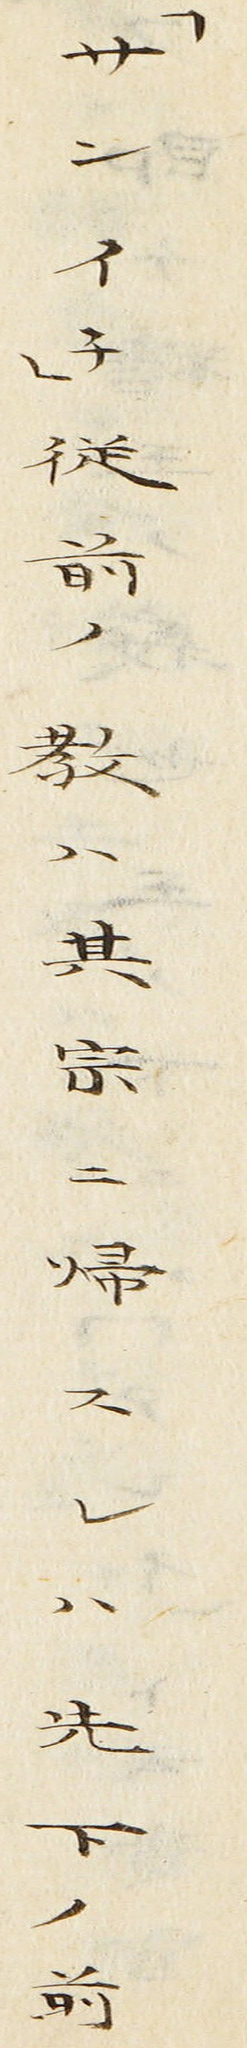〇「サンイチ」従前ノ教ハ其宗ニ帰スレハ先下ノ前
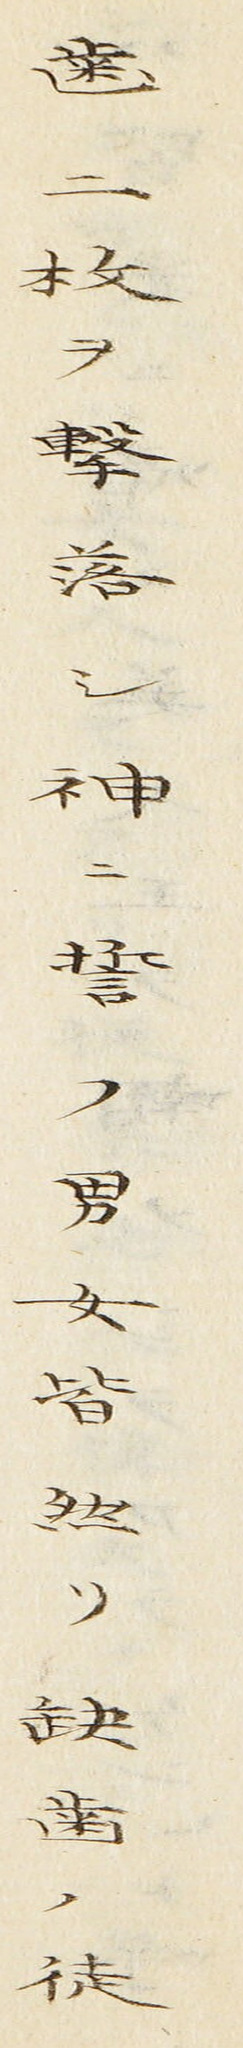歯二枚ヲ撃落シ神ニ誓フ男女皆然リ欠歯ノ徒
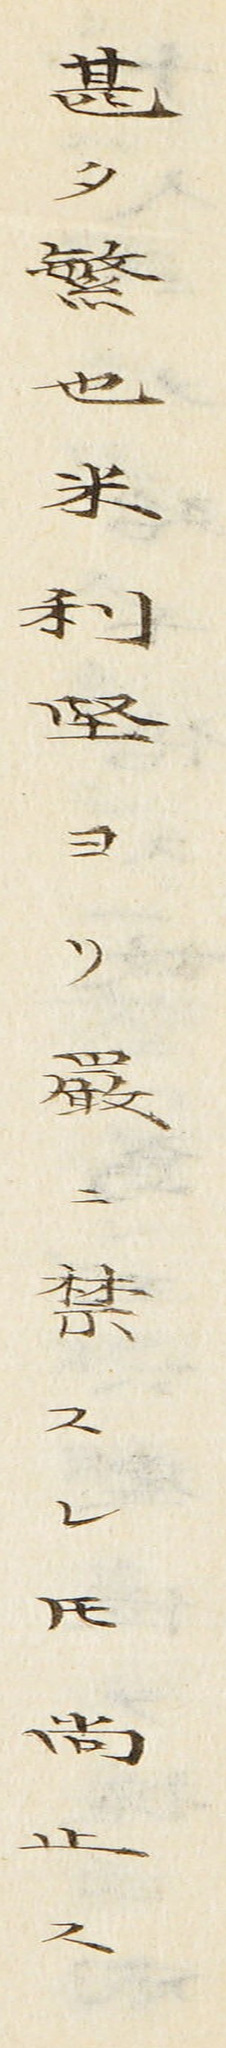甚タ繁也米利堅ヨリ厳ニ禁スレトモ尚止ス
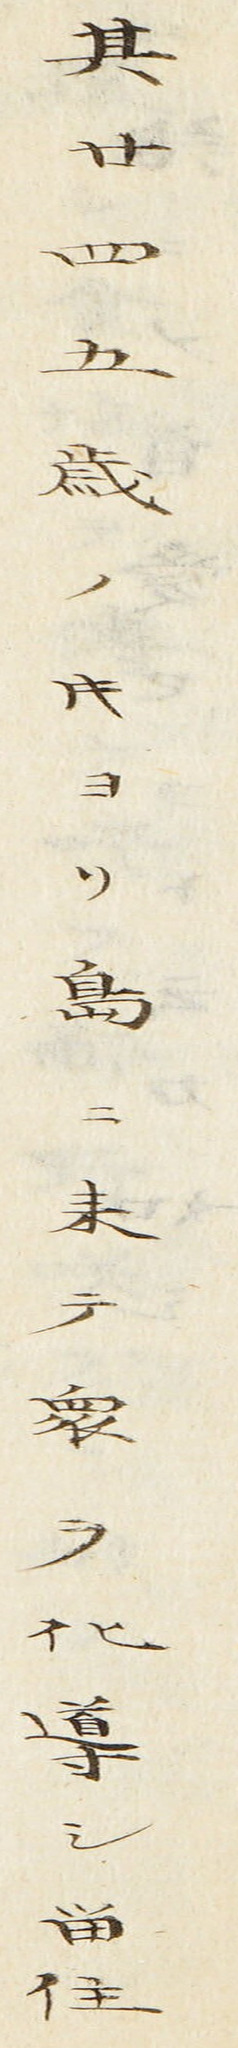其廿四五歳ノトキヨリ島ニ来テ衆ヲ化導シ留住
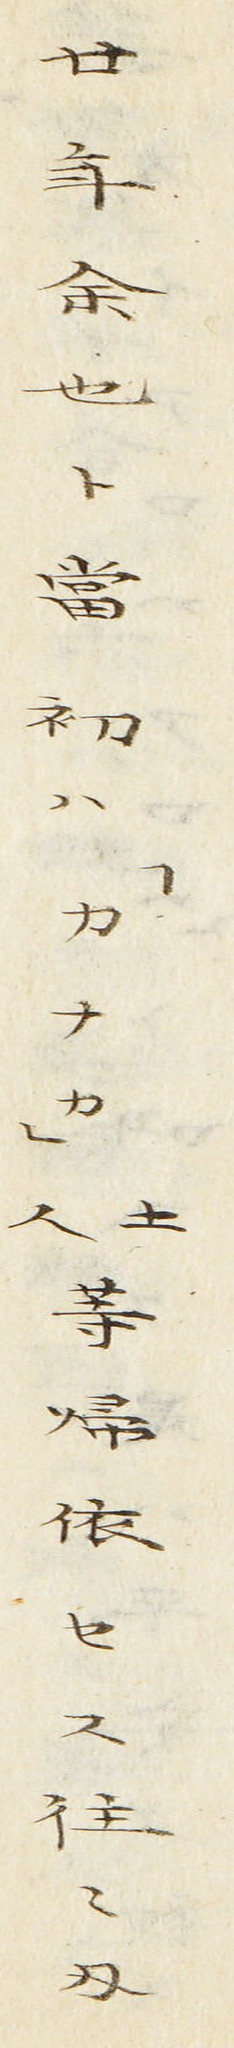廿年余也ト当初ハ「カナカ」土人等帰依セス往々刃
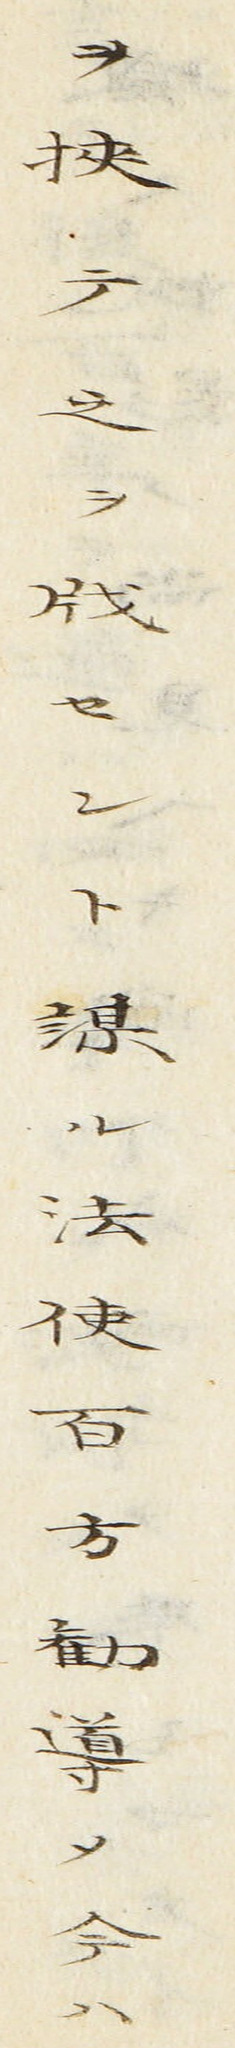ヲ挟テ之ヲ戕セント謀ル法使百方勧導シテ今ハ
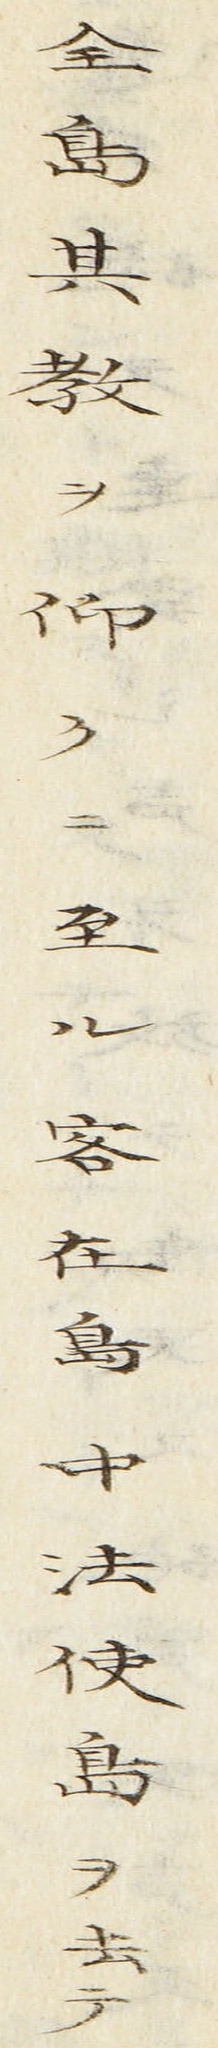全島其教ヲ仰クニ至ル客在島中法使島ヲ去テ
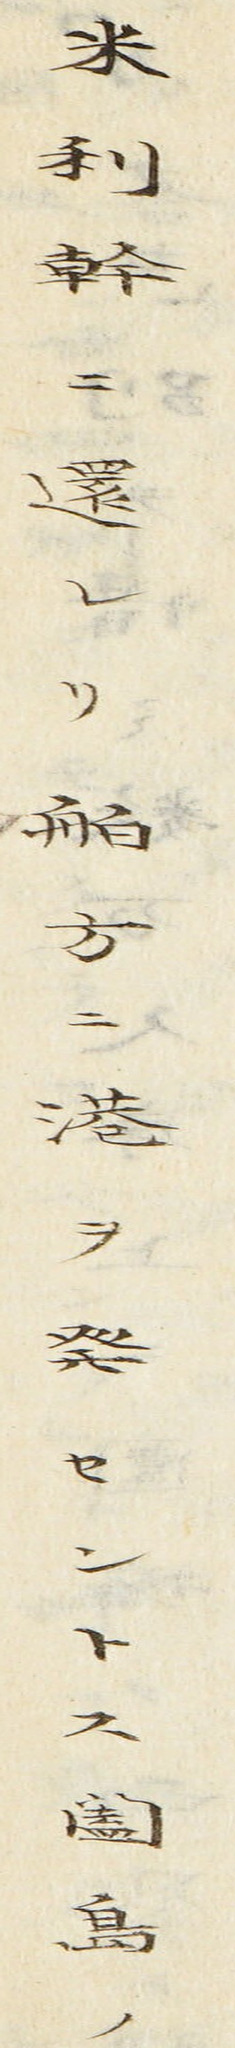米利幹ニ還レリ舶方ニ港ヲ発セントス闔島ノ

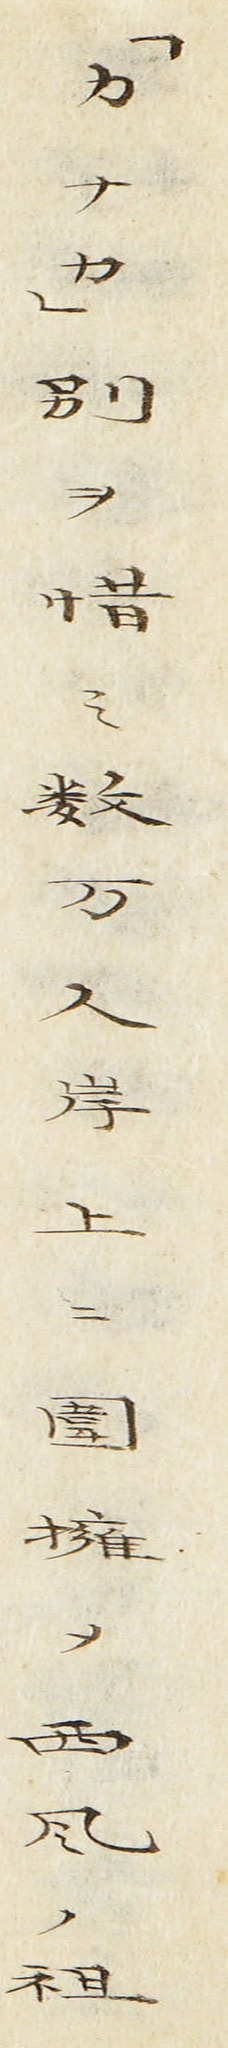「カナカ」別ヲ惜ミ数万人岸上ニ囲擁シテ西風ノ祖
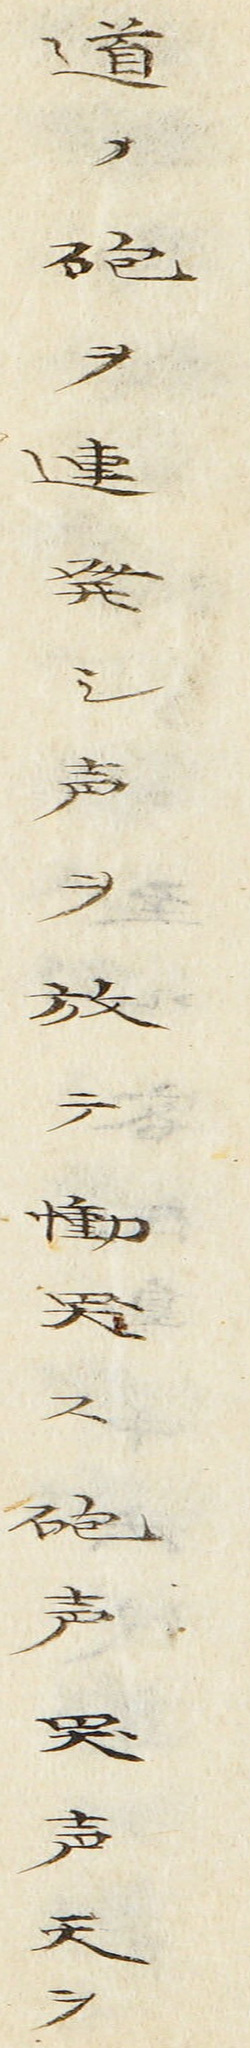道ノ砲ヲ連発シ声ヲ放テ慟哭ス砲声哭声天ヲ
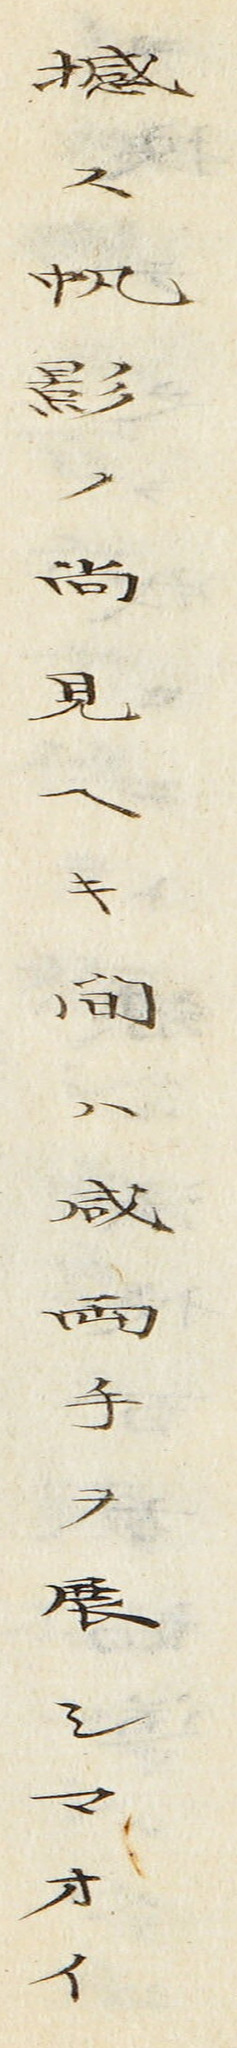撼ス帆影ノ尚見ヘキ間ハ咸両手ヲ展シマオイ
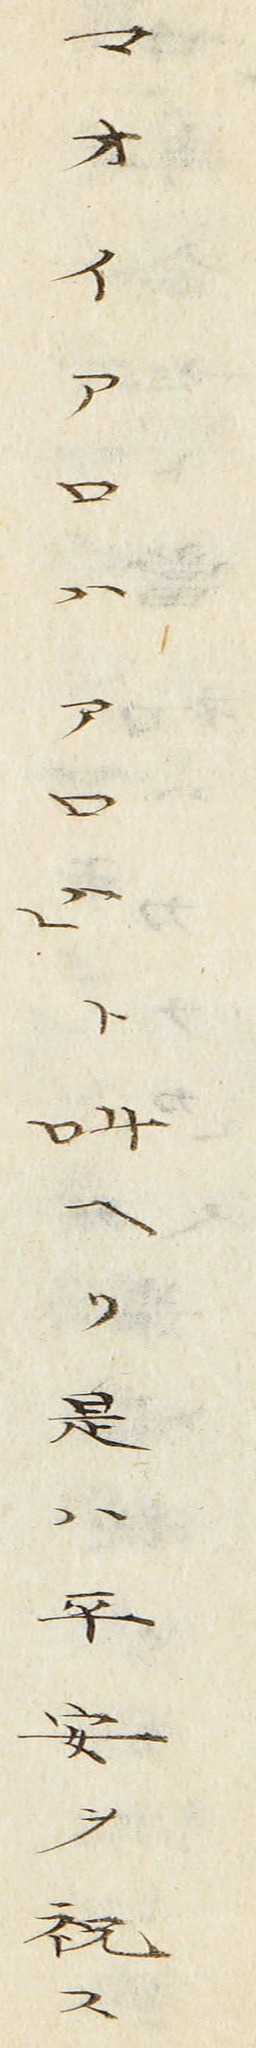マオイアロハアロハ」ト叫ヘリ是ハ平安ヲ祝ス
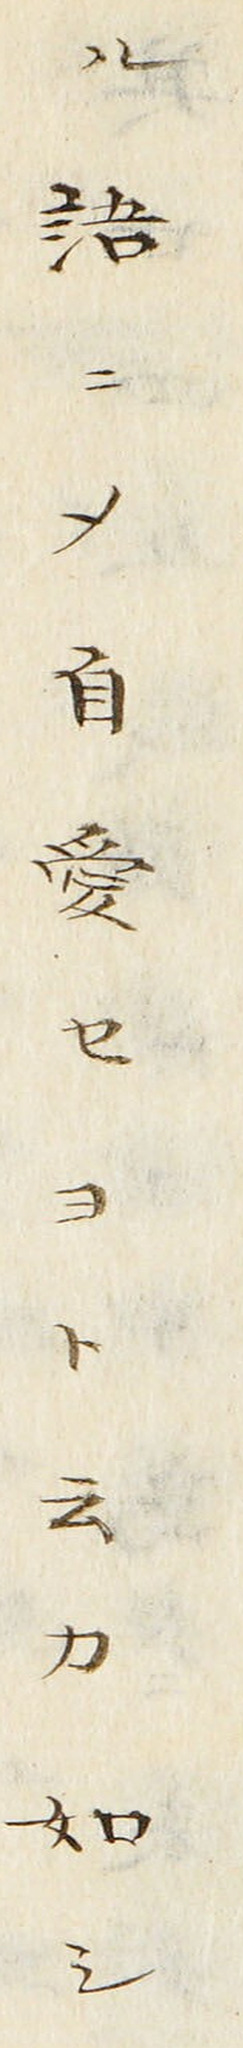ル語ニシテ自愛セヨト云カ如シ
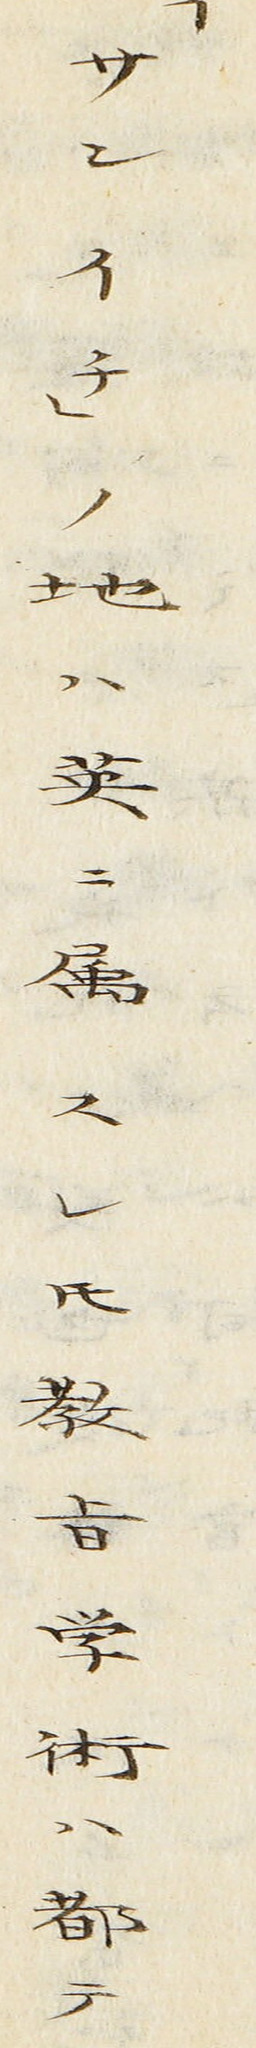〇「サンイチ」ノ地ハ英ニ属スレトモ教旨学術ハ都テ
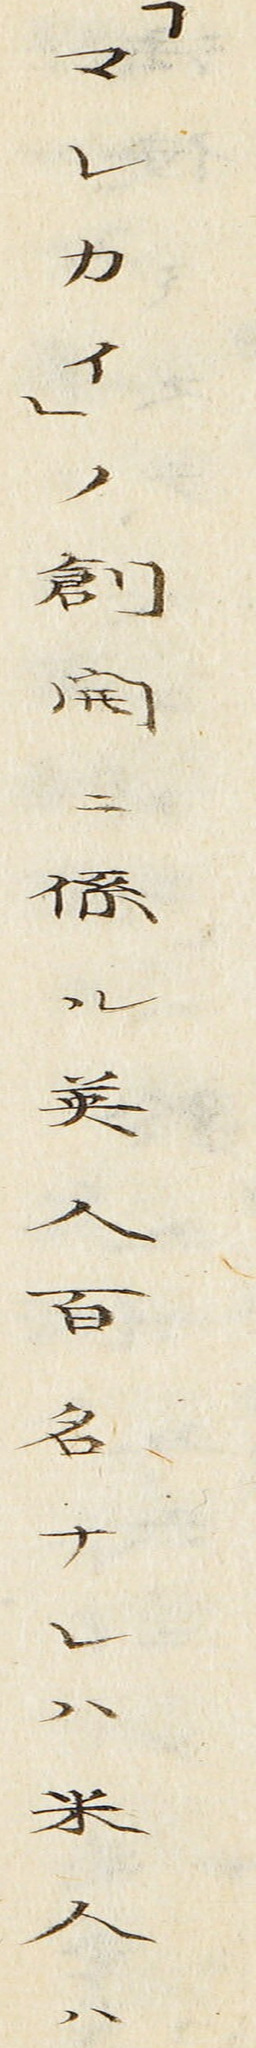「マレカイ」ノ創開ニ係ル英人百人ナレハ米人ハ
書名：蕃談
